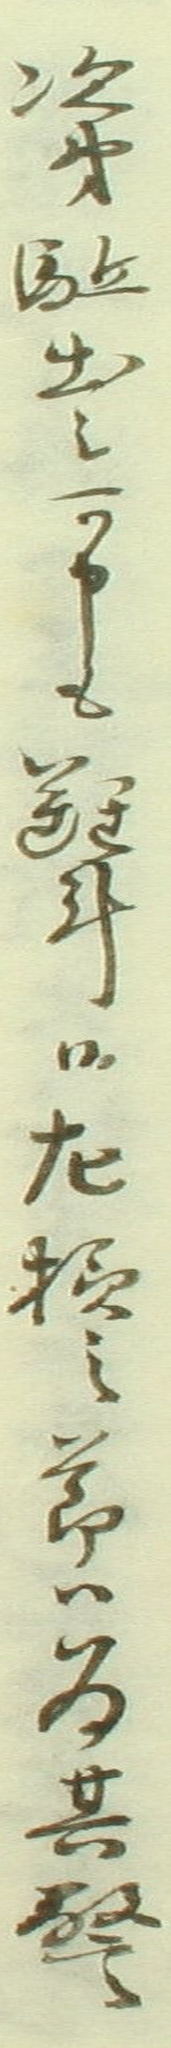次第駈出し可申も難計候左様之節は為其警
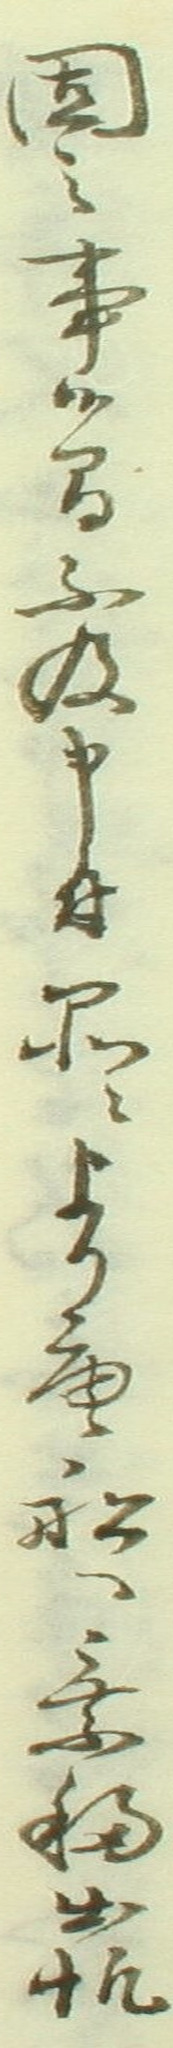固之事候間不及申付品により唐船へ乗移出帆
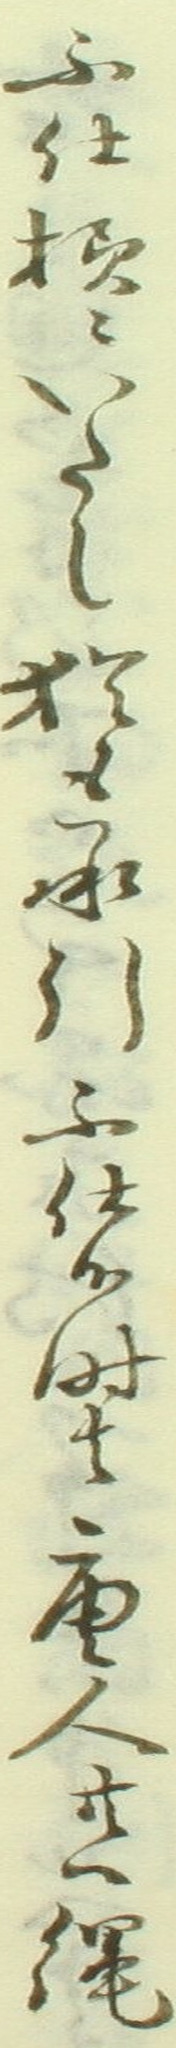不仕様にいたし猶も承引不仕候時は唐人共へ縄
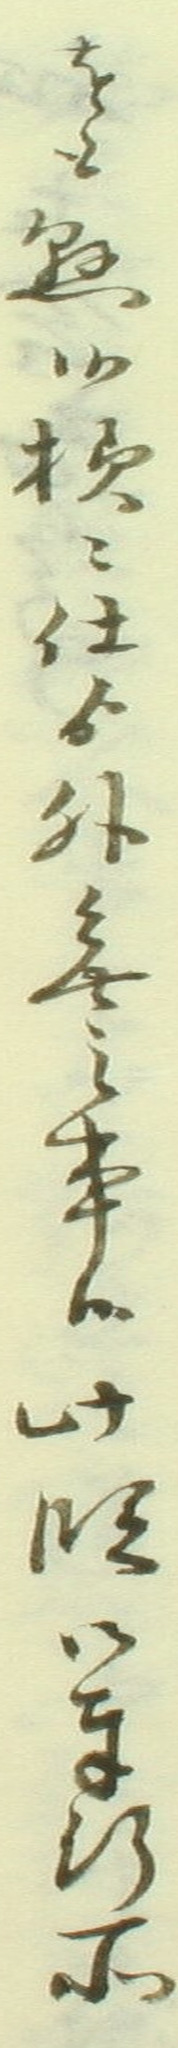をも懸候様に仕ゟ外無之事候此段御奉行所
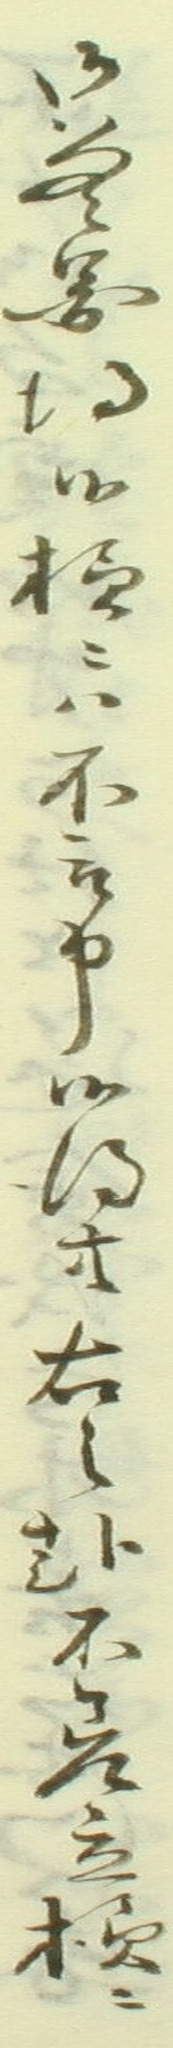御差図得候には不被申候得共右之赴不差立様に
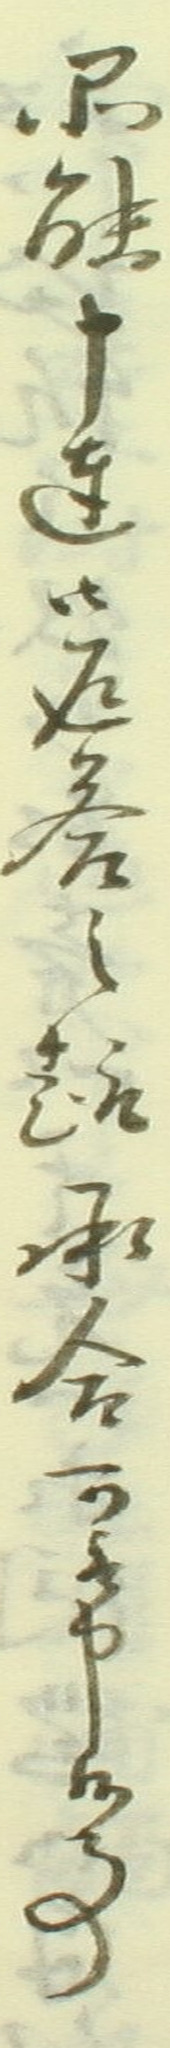品能申達御返答之趣承合可被申候事
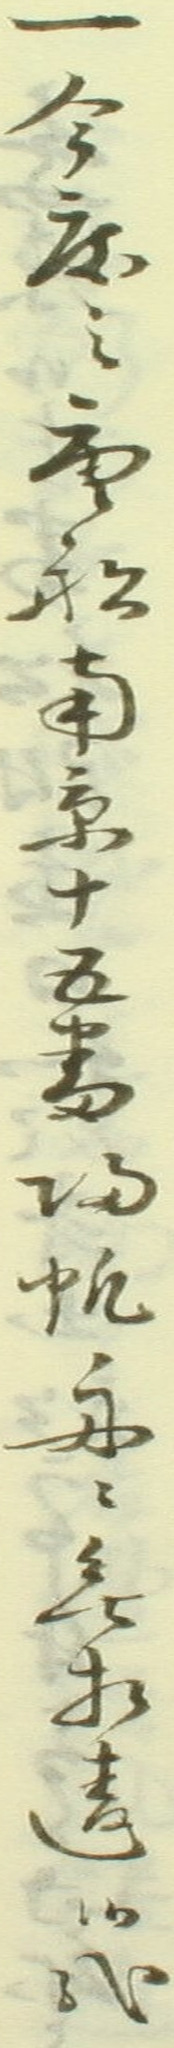一今度之唐船南京十五番帰帆帰帆舟に無相違候哉
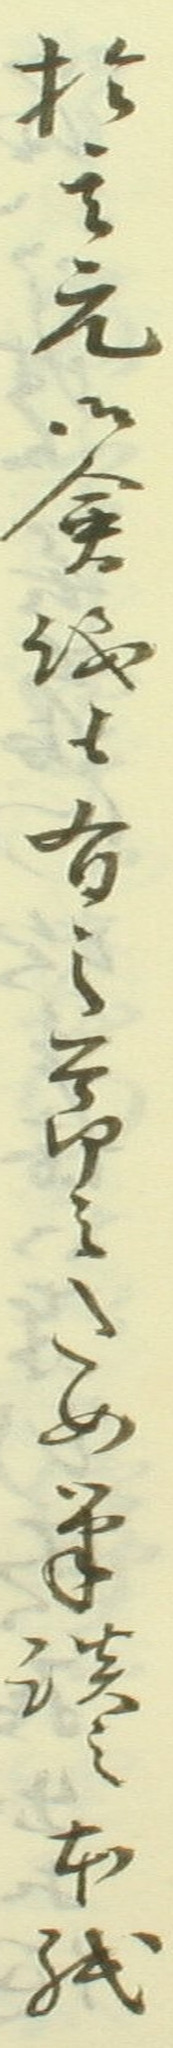於其元御僉儀も有之節之ため筆談之本紙
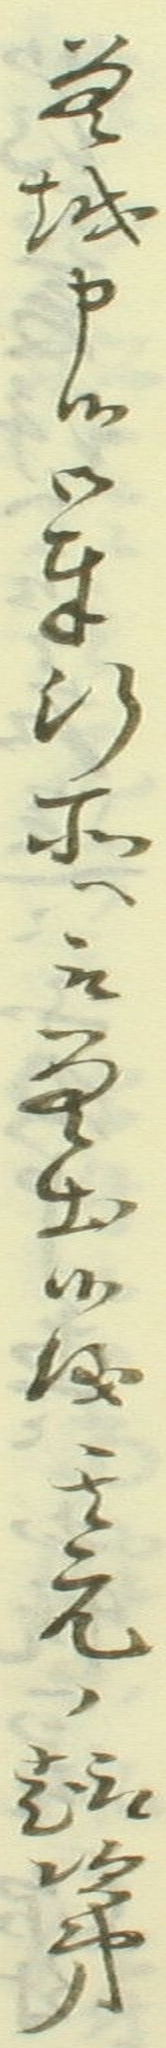差越申候御奉行所へ被差出候儀其元之趣次第
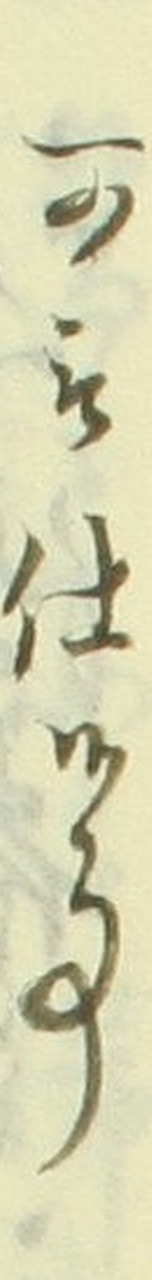可被仕候事
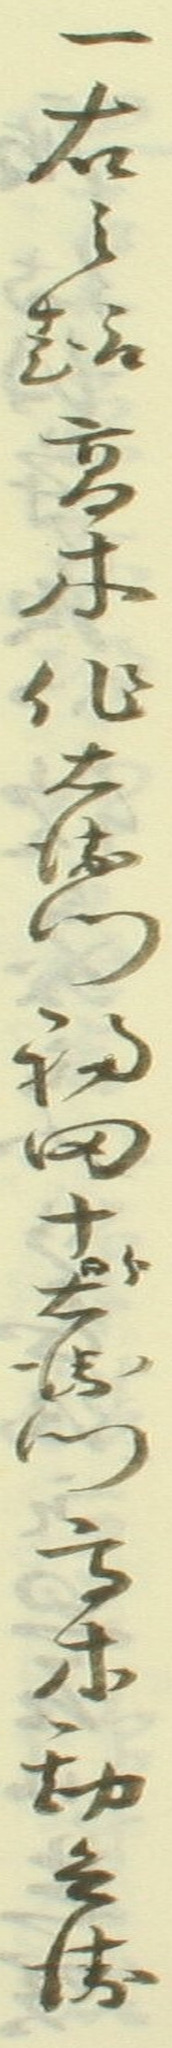一右之趣高木作右衛門福田十◦右衛門高木勘兵衛
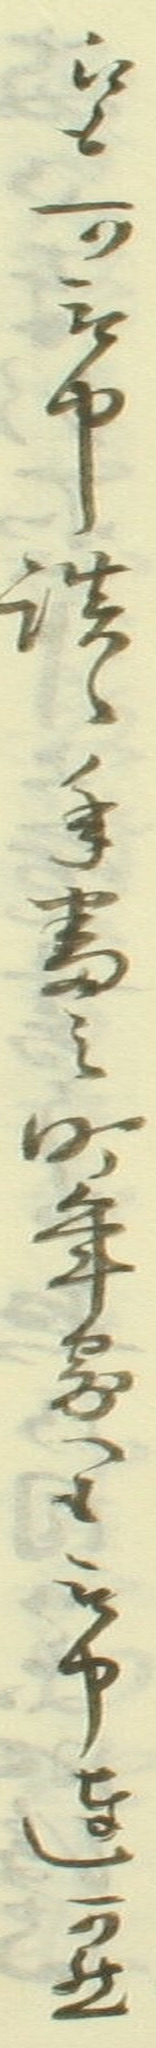共も可被申談候年番之町年寄へも被申達可然
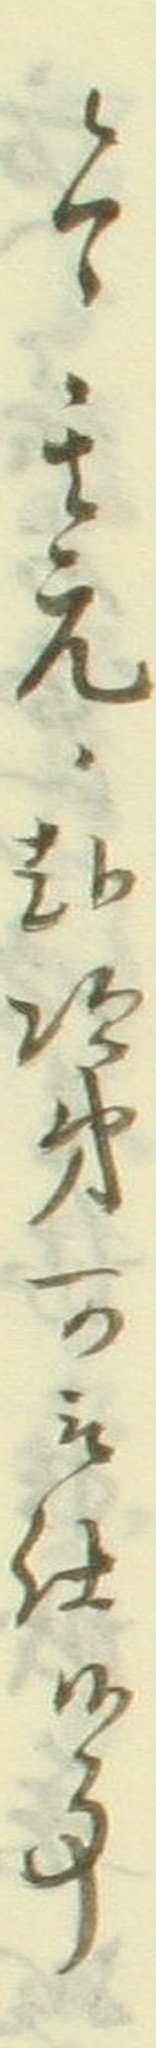候て其元へ赴次第可被仕候事
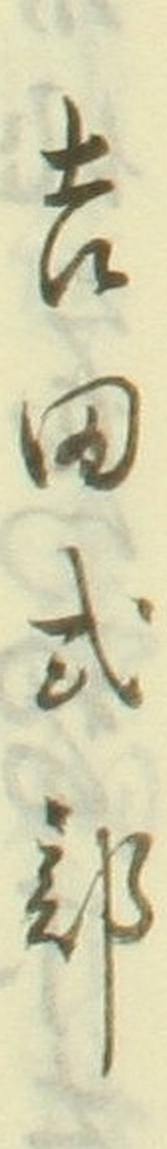吉田式部
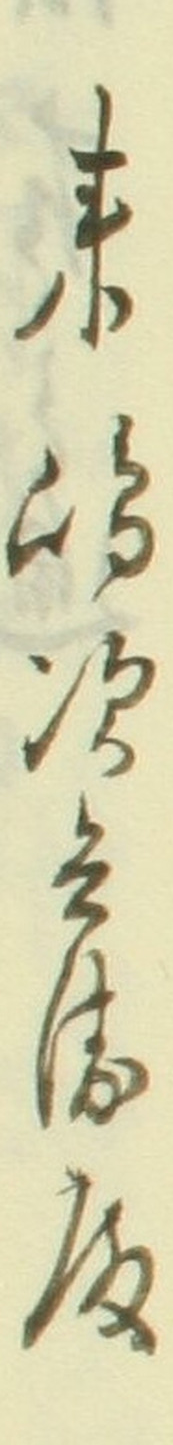来島次兵衛殿

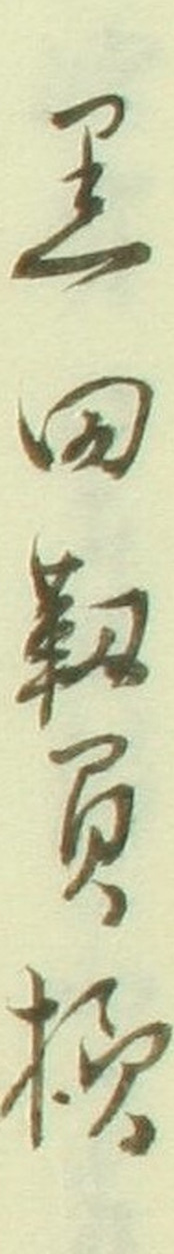黒田靭負様
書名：異国船漂着記
